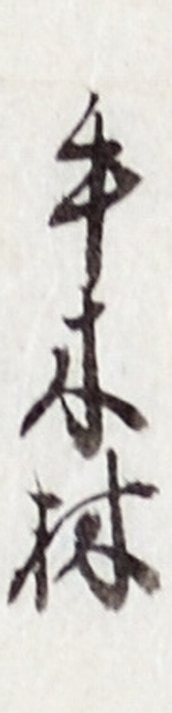雑木林
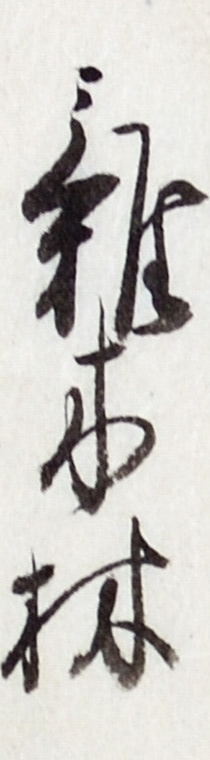雑木林
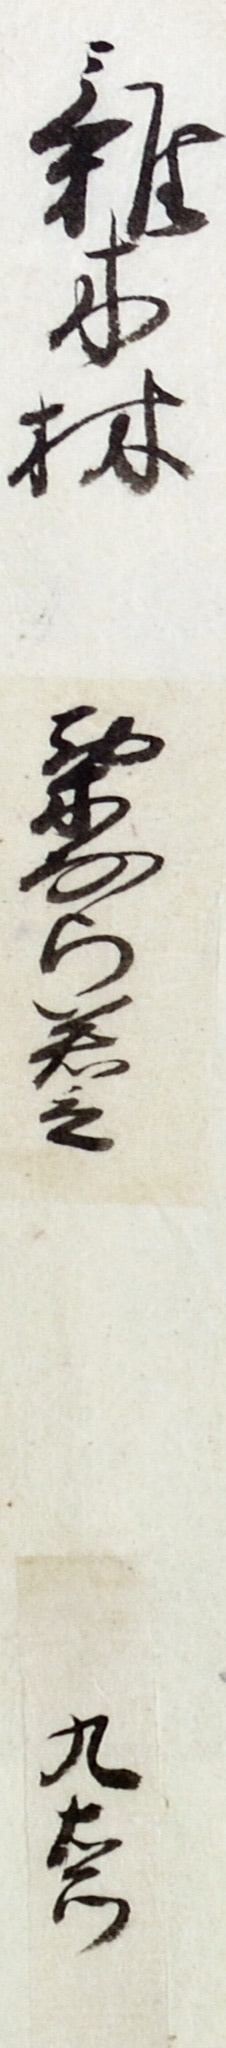雑木林栗なら若立九右衛門
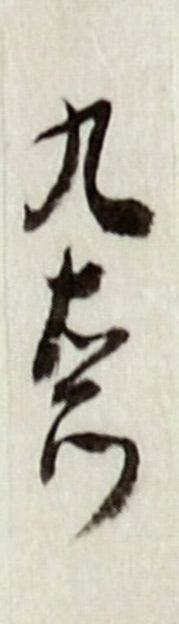与右衛門
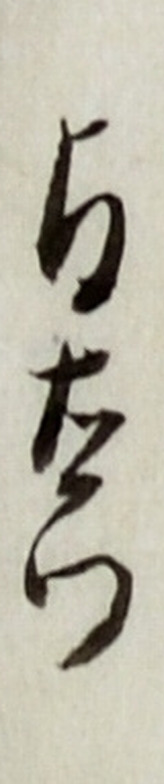与右衛門

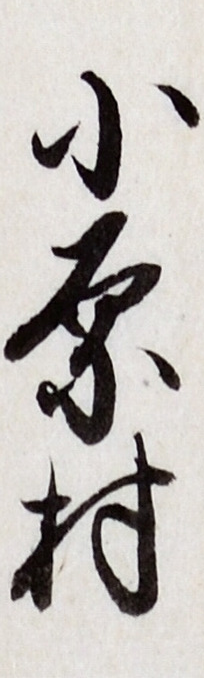小原村
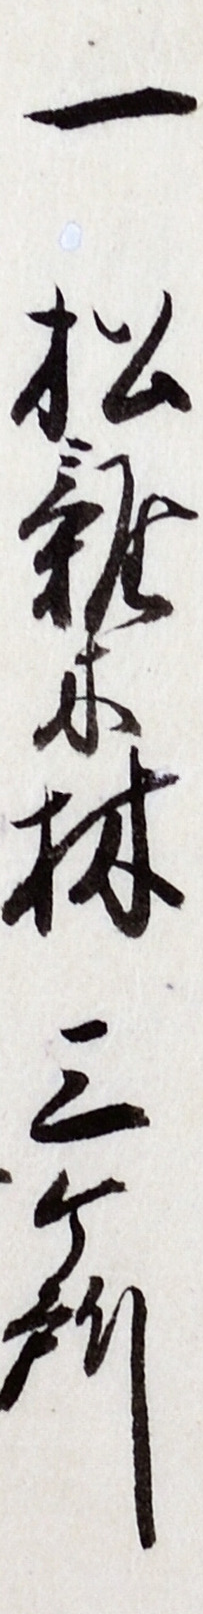一松雑木林三ケ所
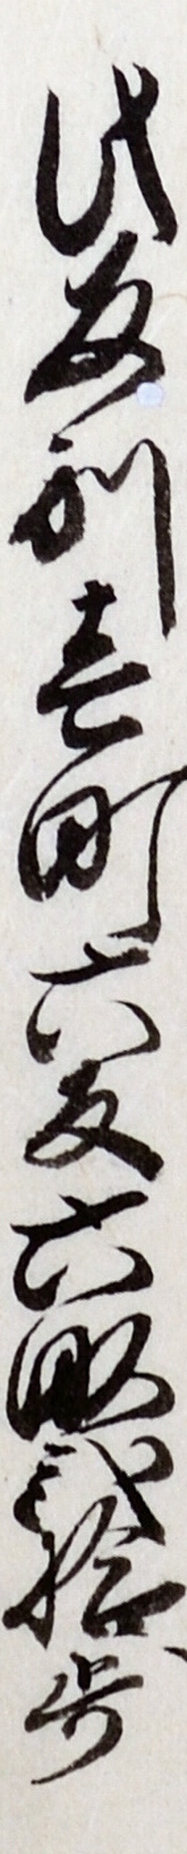此反別壱町六反六畝弐拾歩
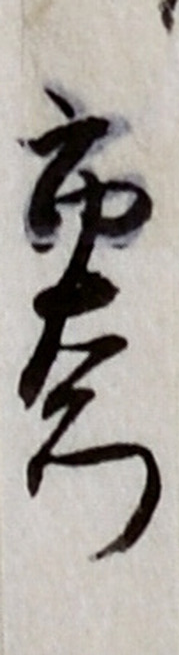百右衛門
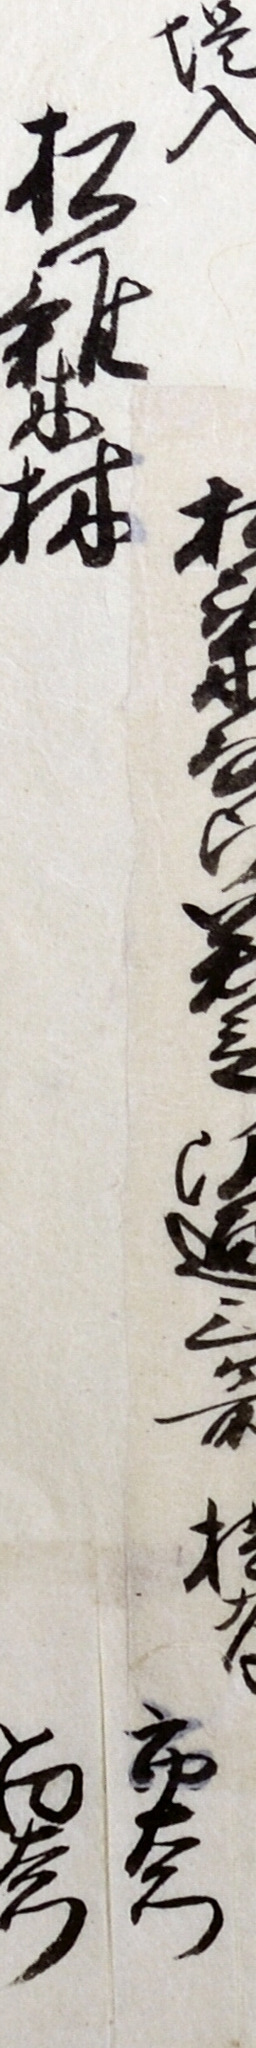松雑木林市右衛門
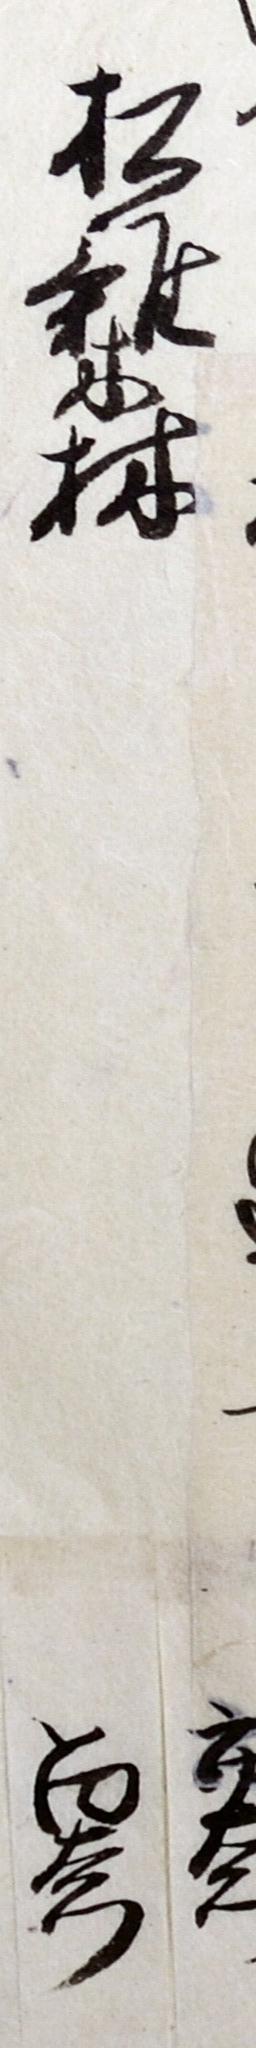松雑木林市右衛門
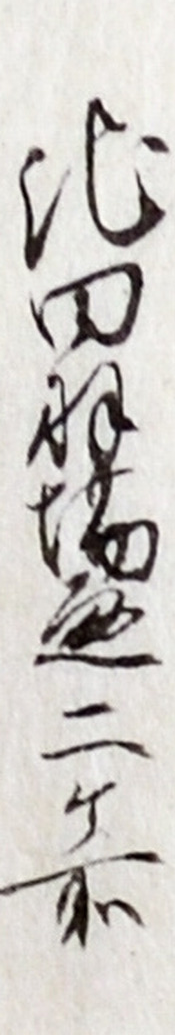池田羽場通二ヶ所
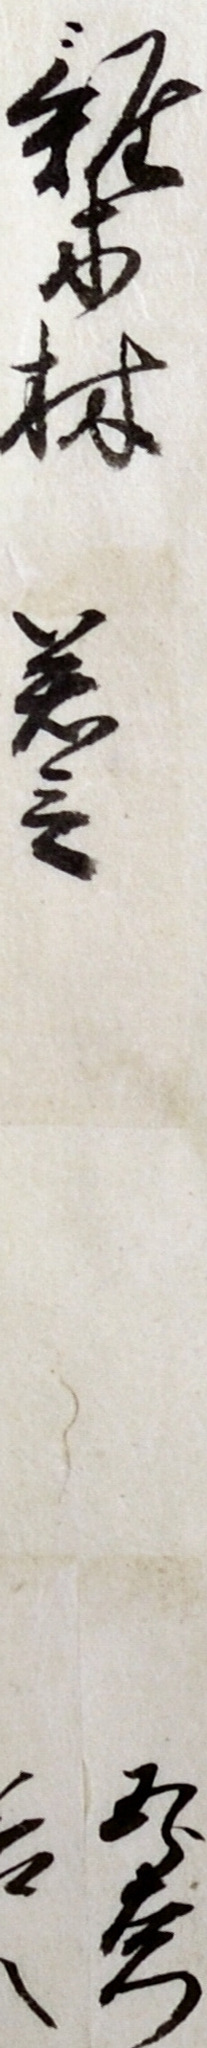雑木林若立五郎右衛門
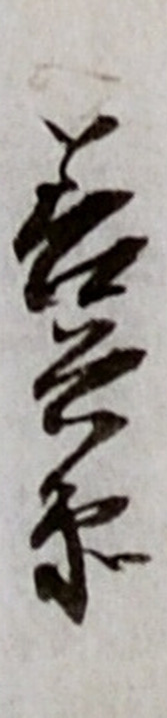善兵衛

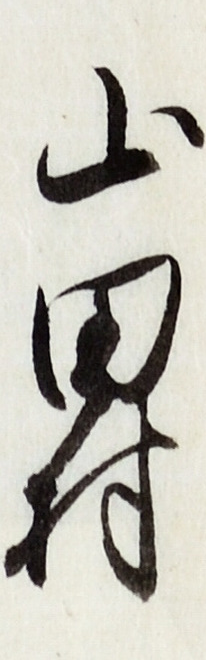山田村
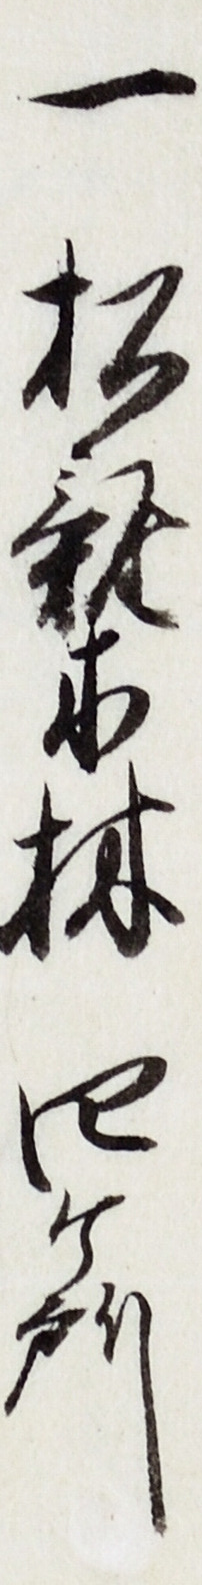一松雑木林四ケ所
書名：御領分中御林御藪附帳
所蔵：伊那市立高遠町図書館・合同会社AMANE
